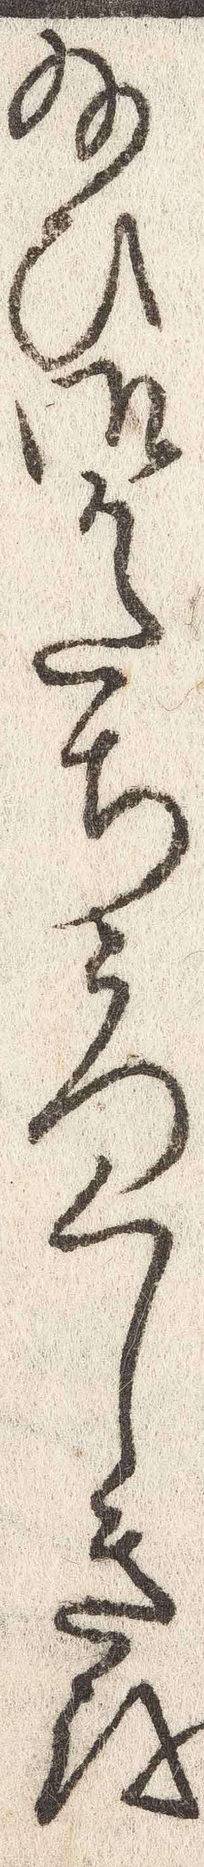給ひ御かたちうつくしきを
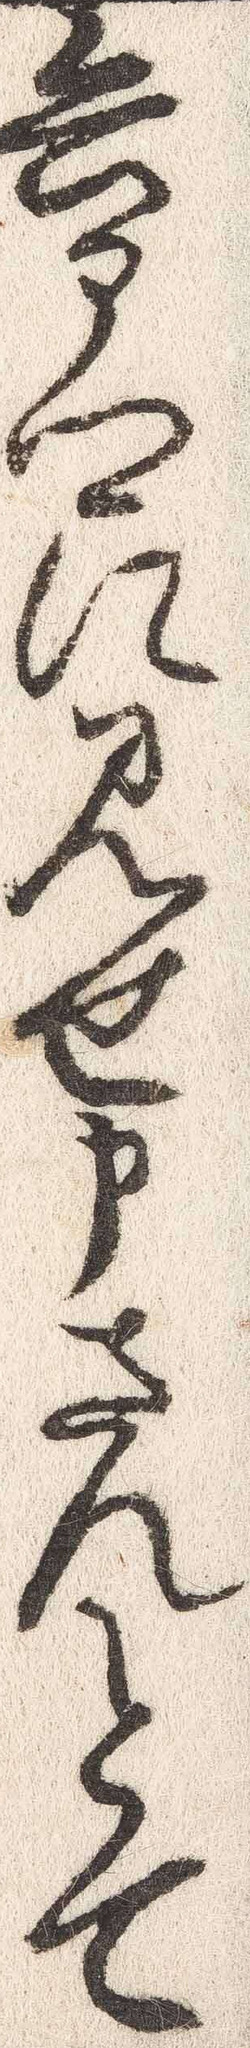兵部卿に見せ申さんとて
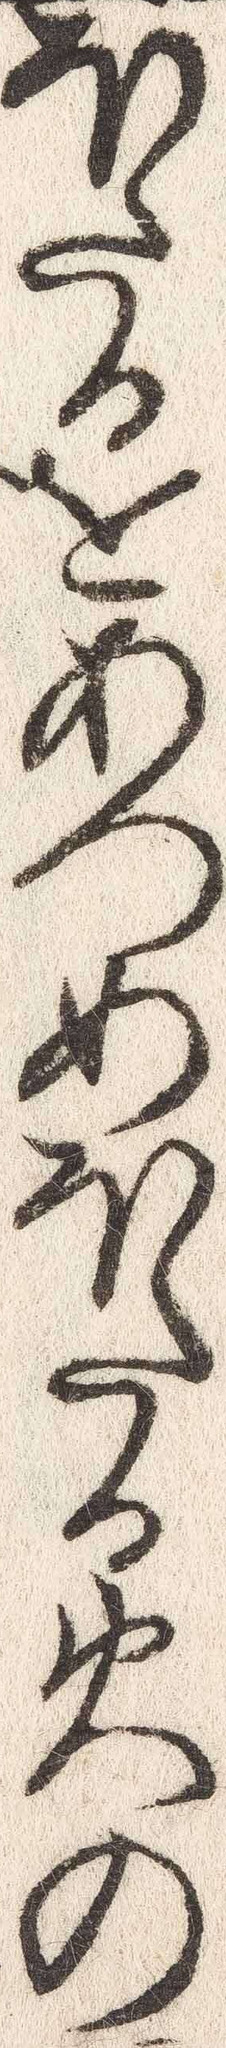ほたるをあつめほたる火の
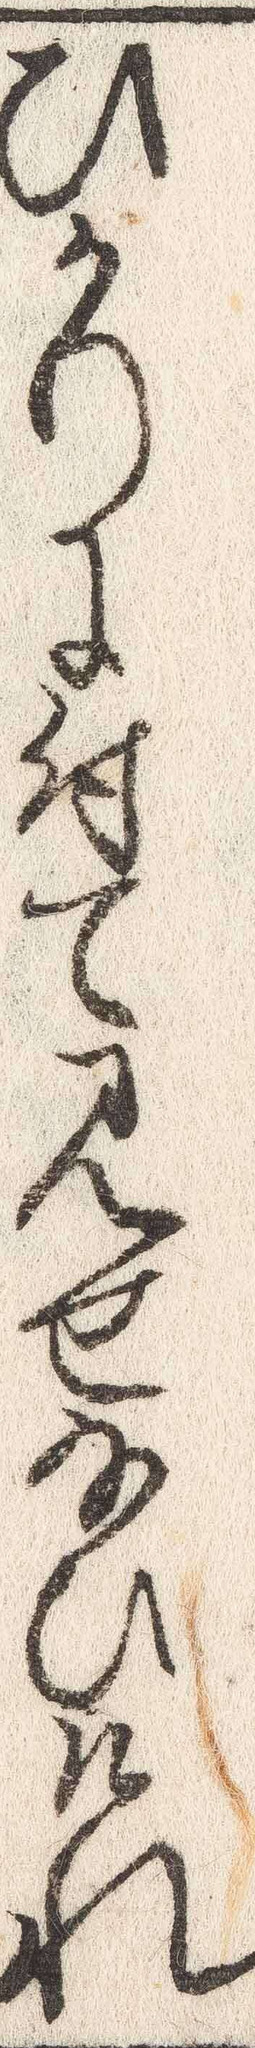ひかりに付て見せ給ひけれ
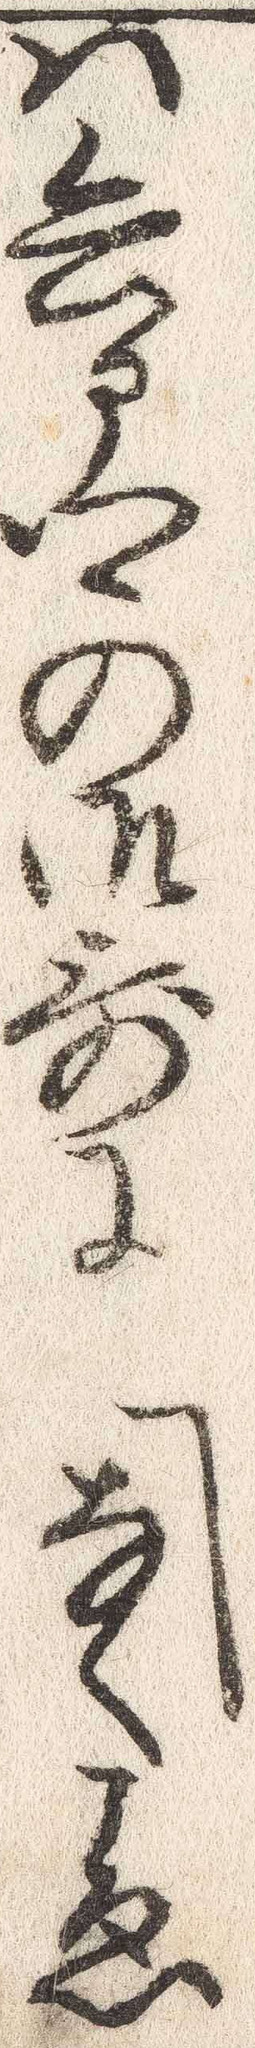は兵部卿の御歌に〽なくこゑ
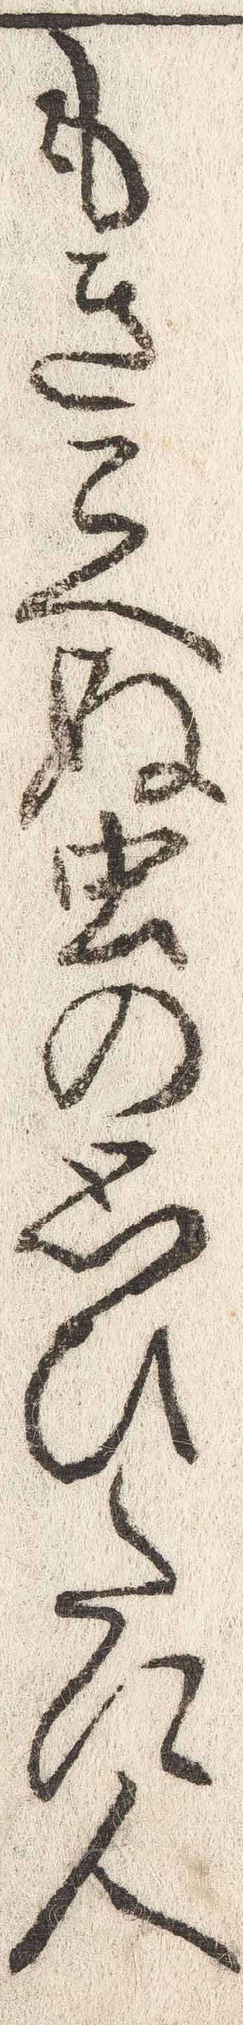もきこへぬ虫の思ひたに人

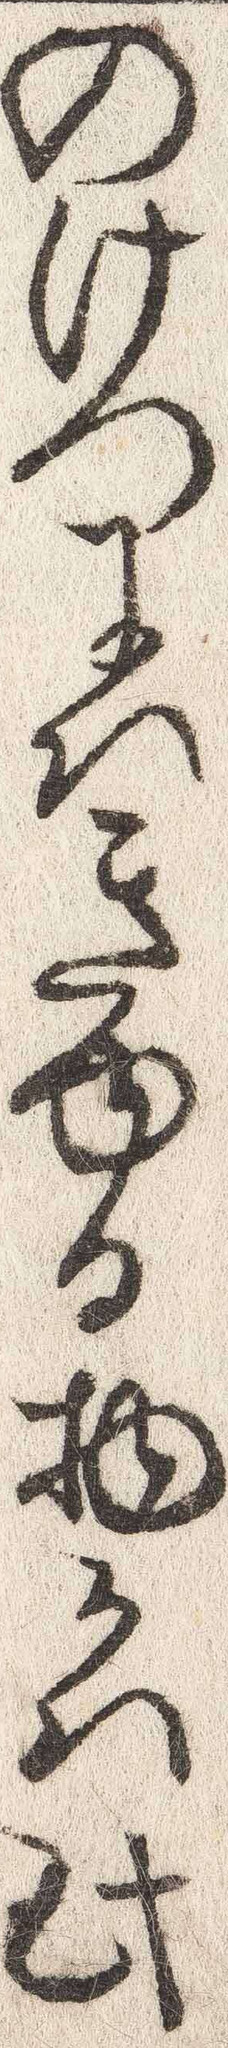のけつにはきゆる物かは此
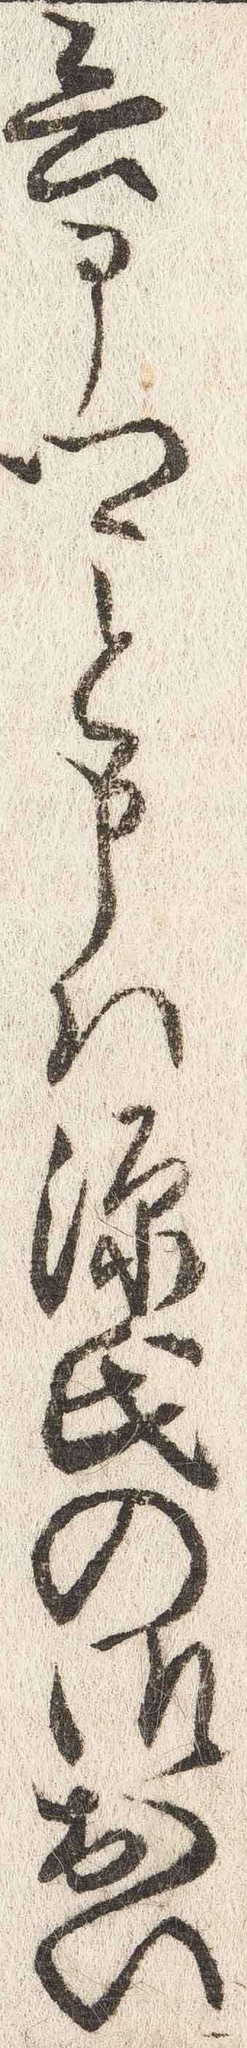兵部卿と申は源氏の御おい
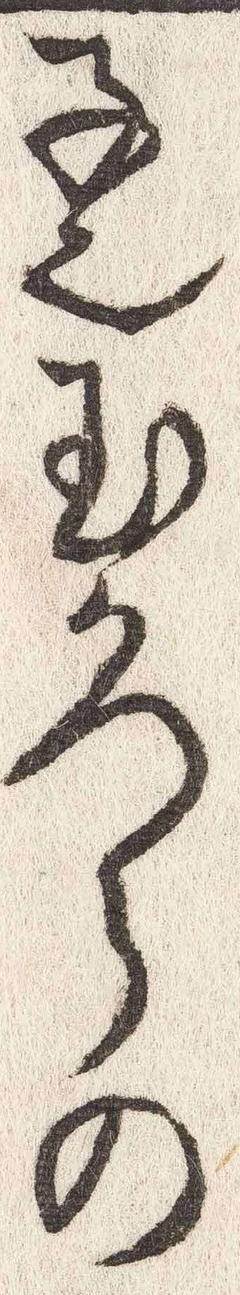子也玉かつらの
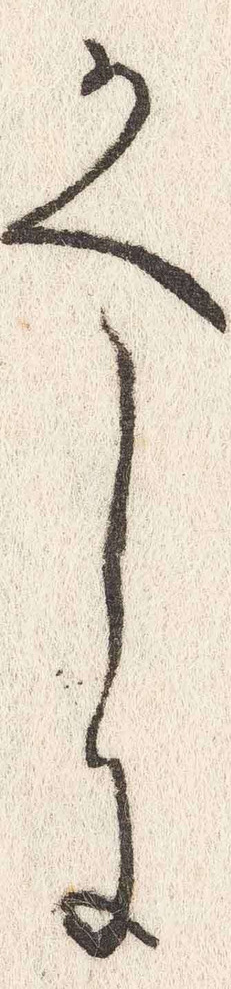かへしに
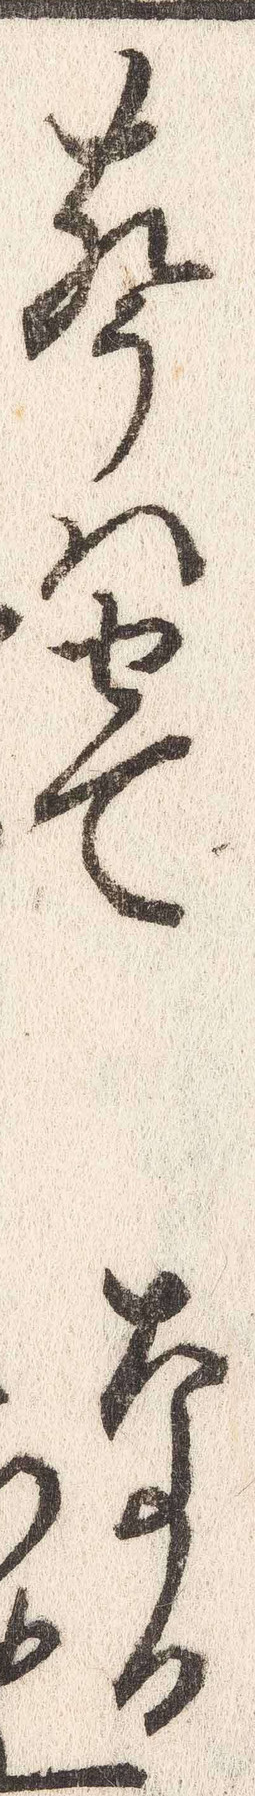声はせてなる
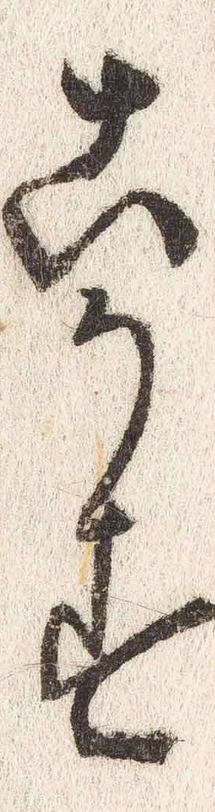こかす
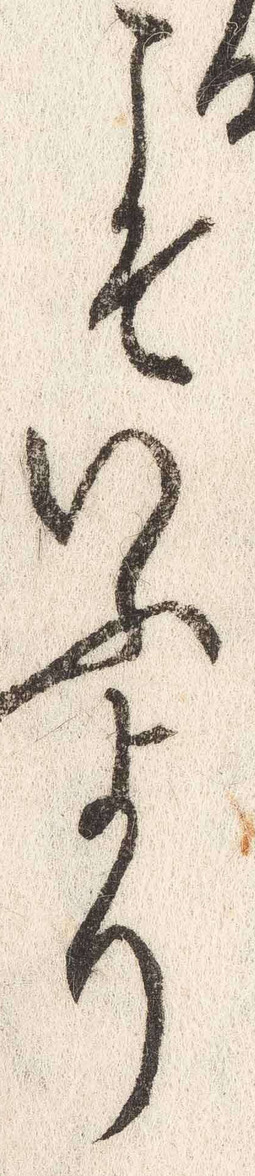こそいふより
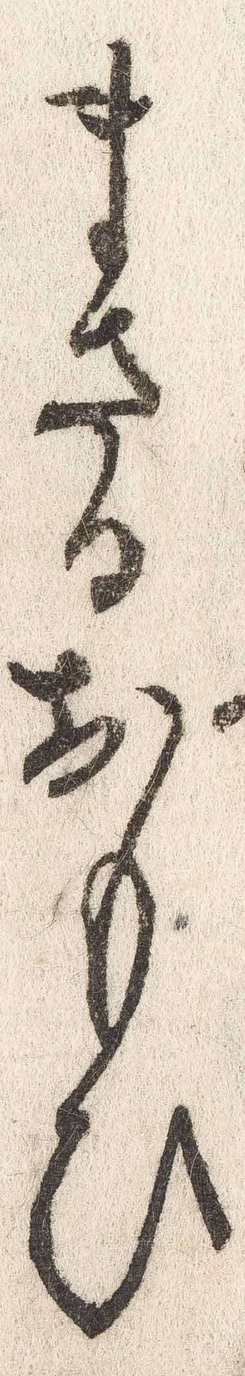まさるおもひ

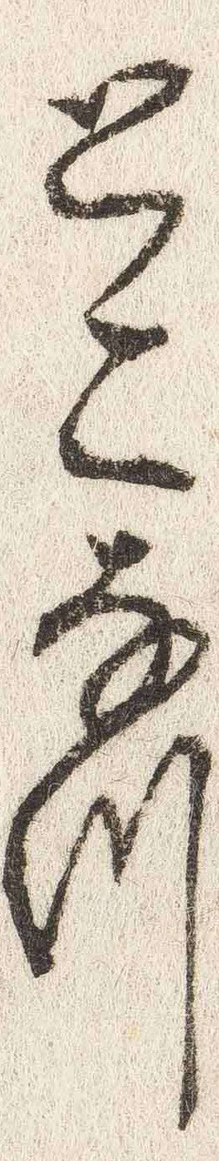とこなつ
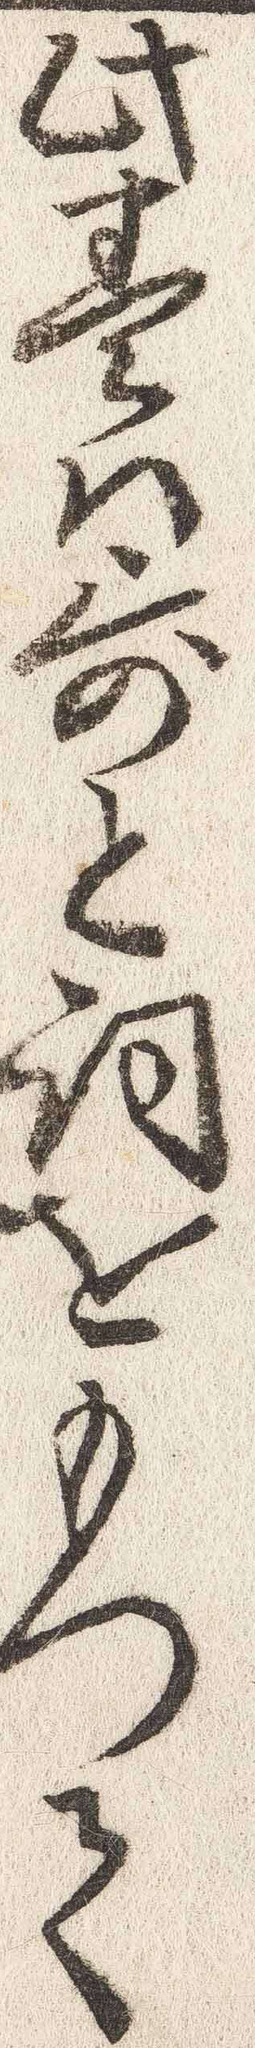此巻は歌と詞をもつて
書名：源氏物語
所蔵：東京学芸大学附属図書館 国文学研究資料館
